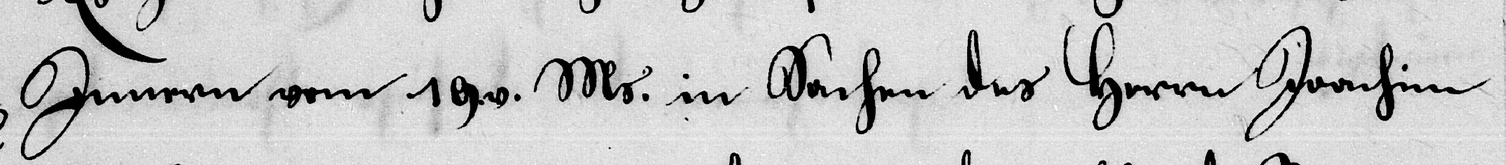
Innern vom 19. v. Ms. in Sachen des Herrn Joachim
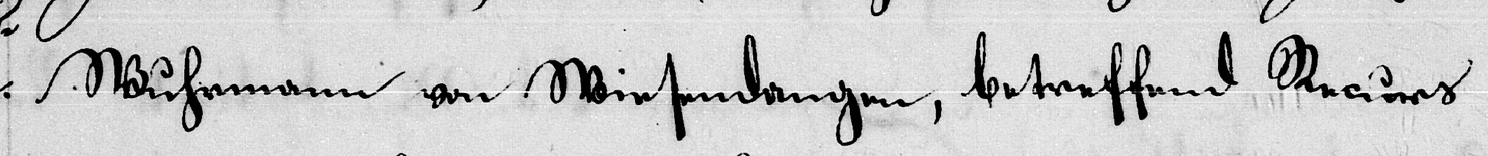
Wuhrmann von Wiesendangen, betreffend Recurs
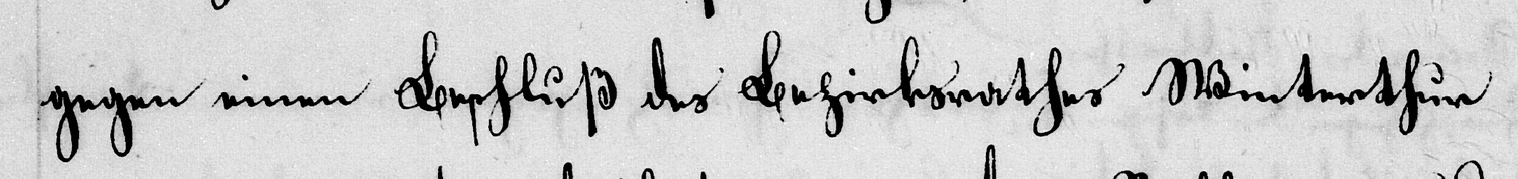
gegen einen Beschluß des Bezirksrathes Winterthur
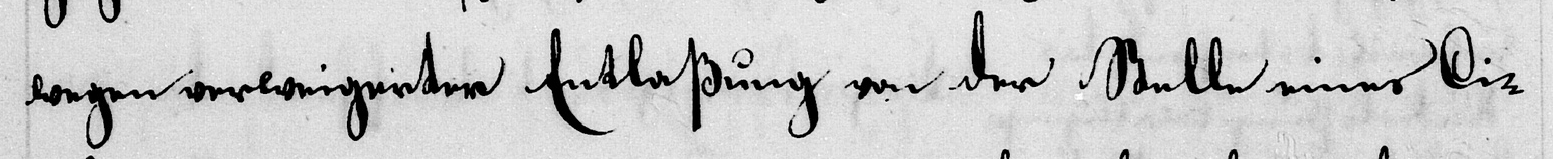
wegen verweigerter Entlaßung von der Stelle eines Ci¬
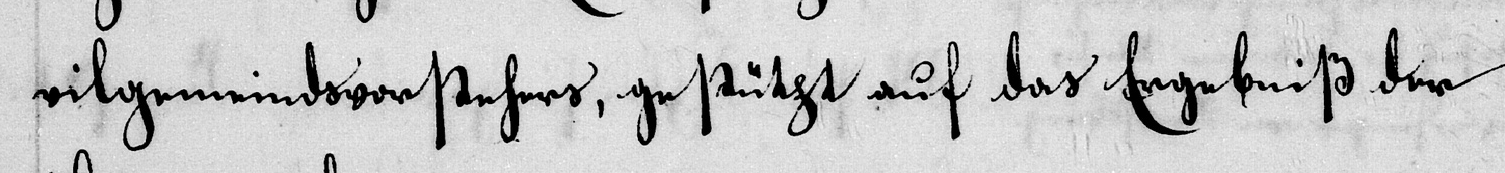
vilgemeindsvorstehers, gestützt auf das Ergebniß der
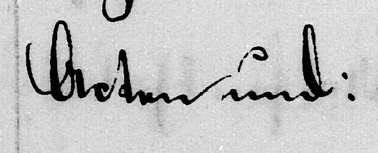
Acten und:
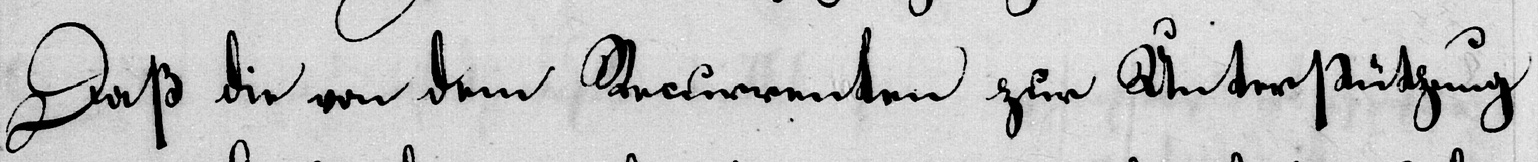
Daß die von dem Recurrenten zur Unterstützung
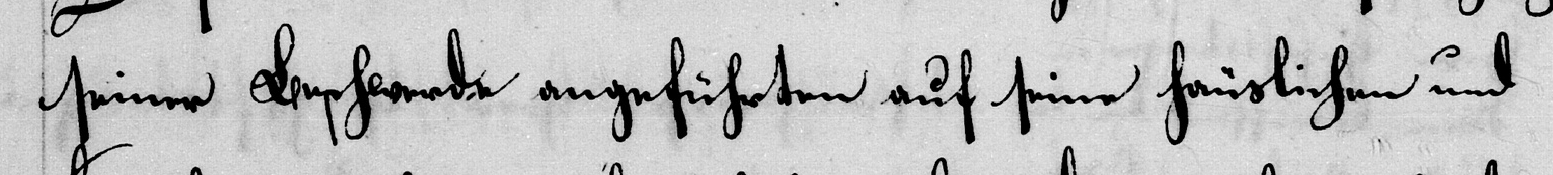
seiner Beschwerde angeführten auf seine häuslichen und
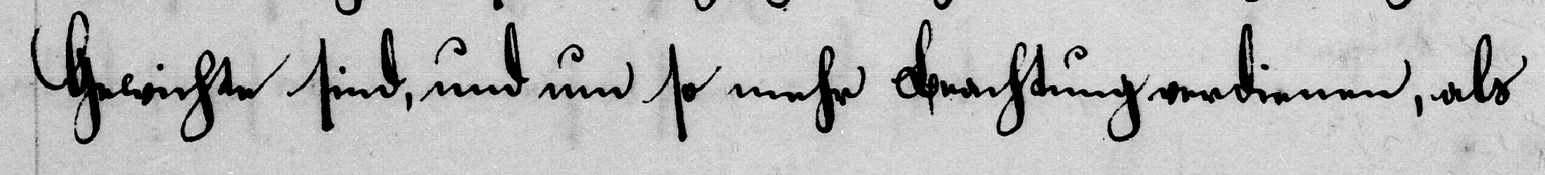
Gewichte sind, und um so mehr Beachtung verdienen, als
